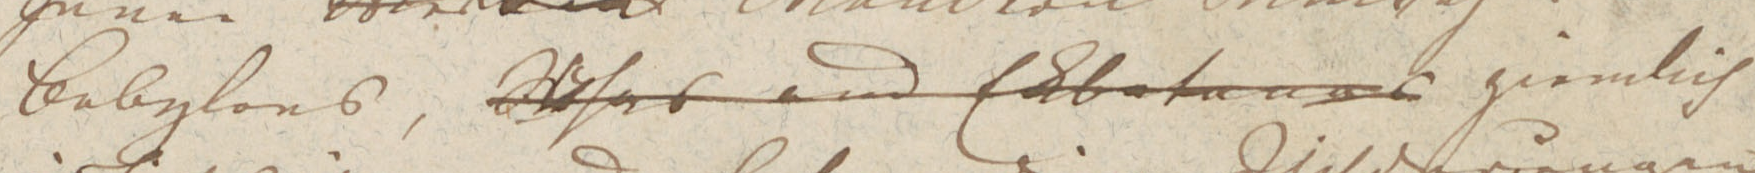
Babylons, Susas und Ekbatanas ziemlich
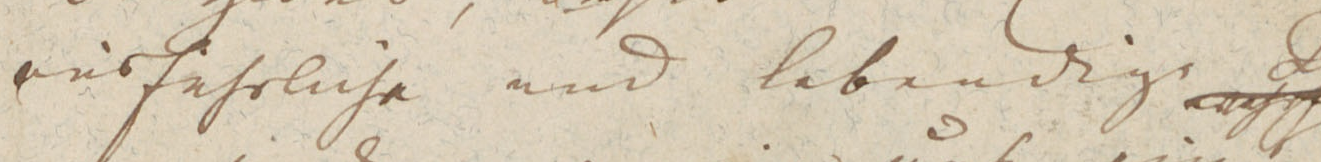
ausführliche und lebendige
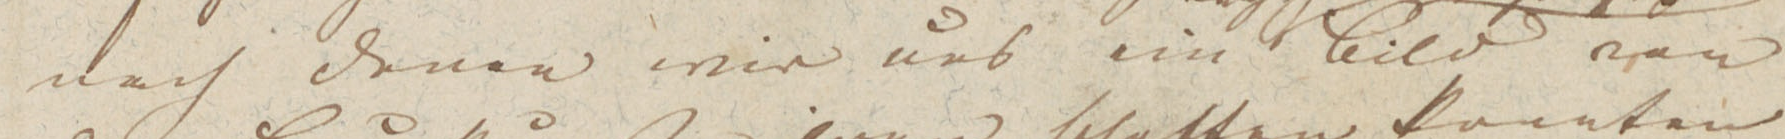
nach denen wir uns ein wahres richtiges Bild von
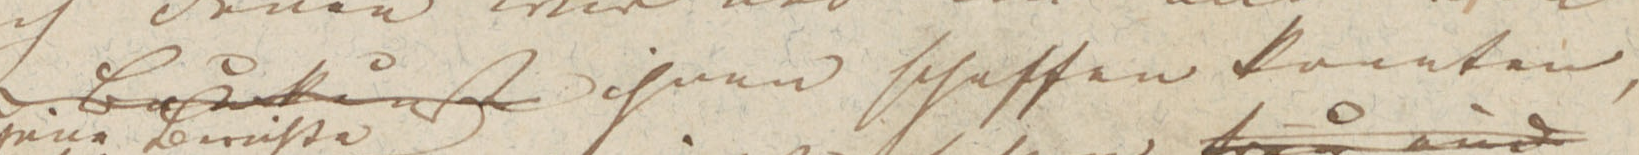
Baukunst ihnen schaffen konnten,
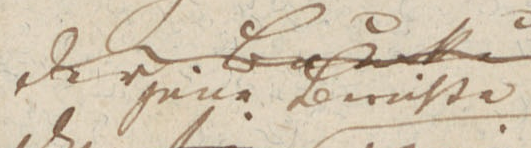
da sie jene Berichte
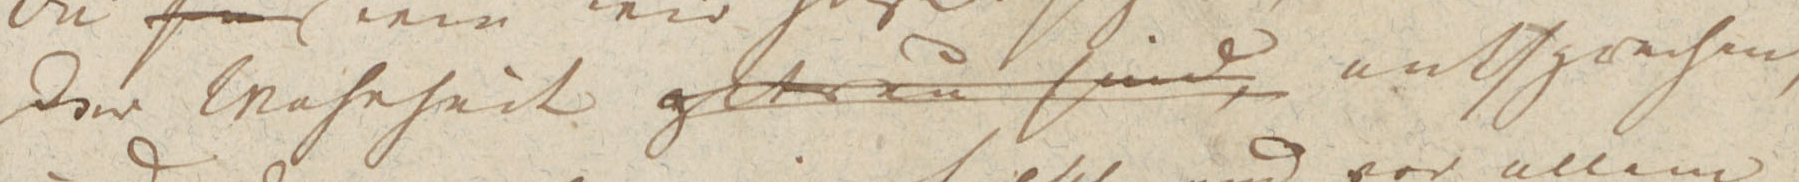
der Wahrheit getreu sind, entsprechen,
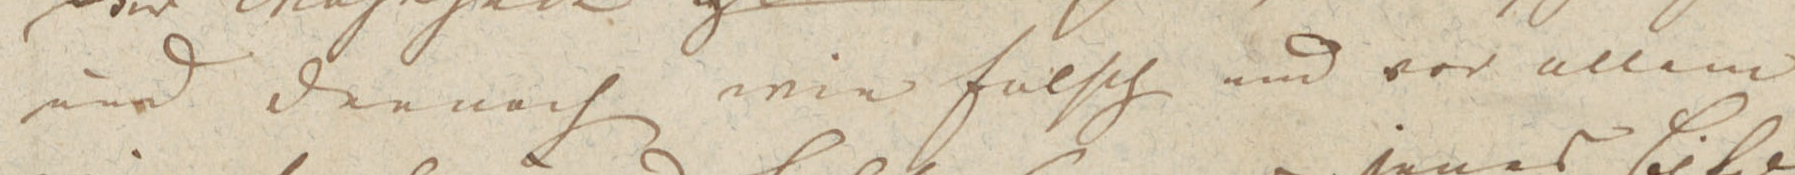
und dennoch wie falsch und vor allem
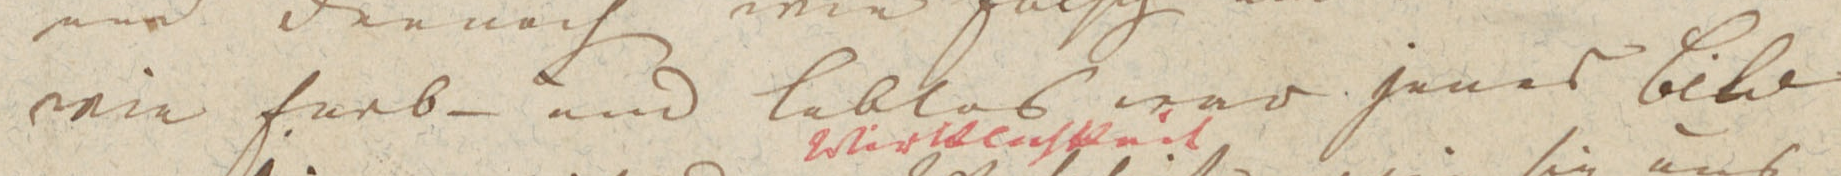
wie farb- und leblos war jenes Bild
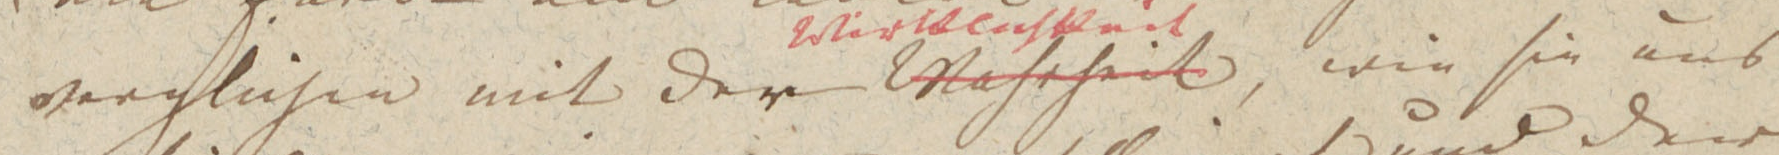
verglichen mit der Wahrheit Wirklichkeit, wie sie uns
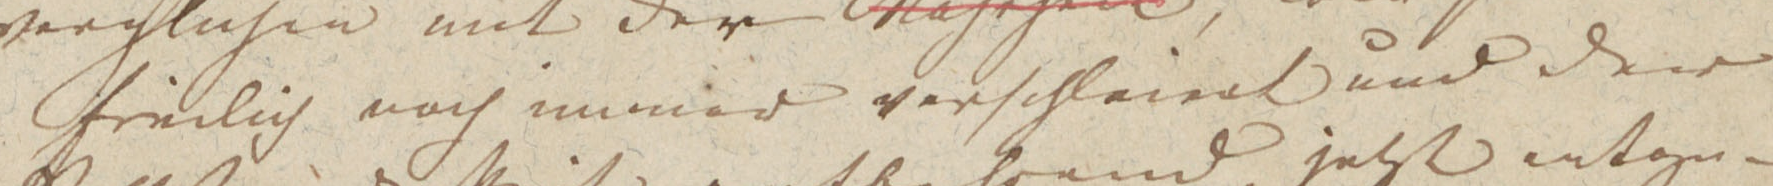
freilich noch immer verschleiert und der
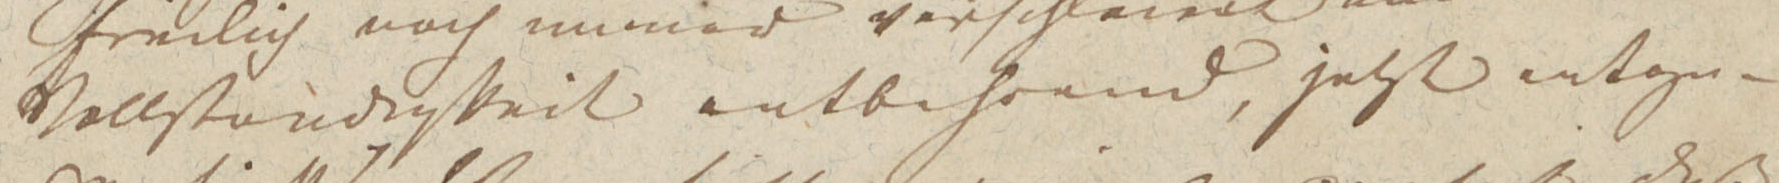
Vollständigkeit entbehrend, jetzt entge-
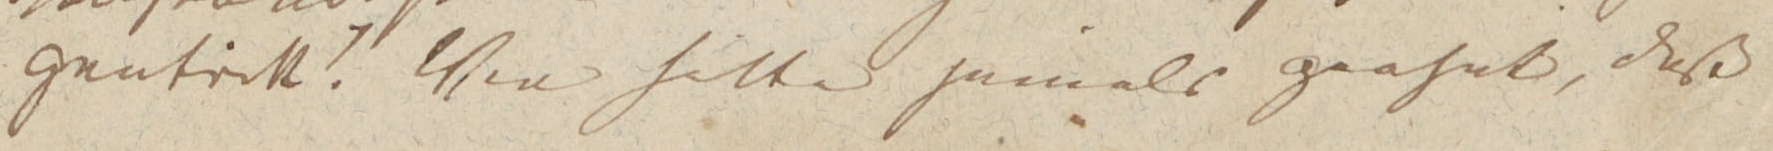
gentritt! Wer hätte jemals geahnt, dass
